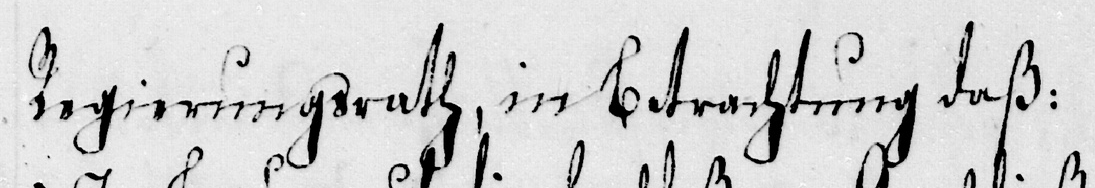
Regierungsrath, in Betrachtung daß:
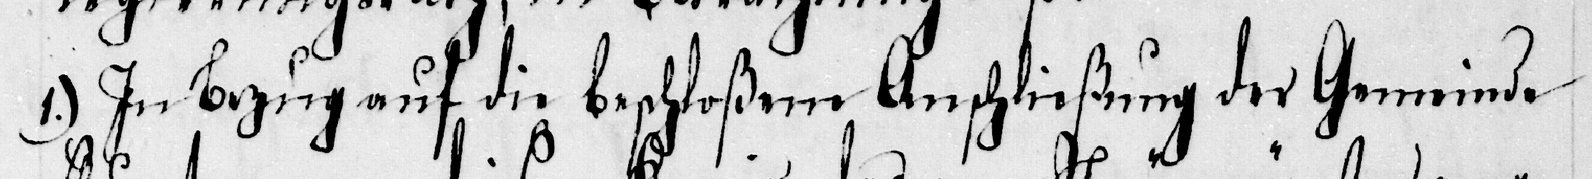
1.) In Bezug auf die beschloßene Anschließung der Gemeinde
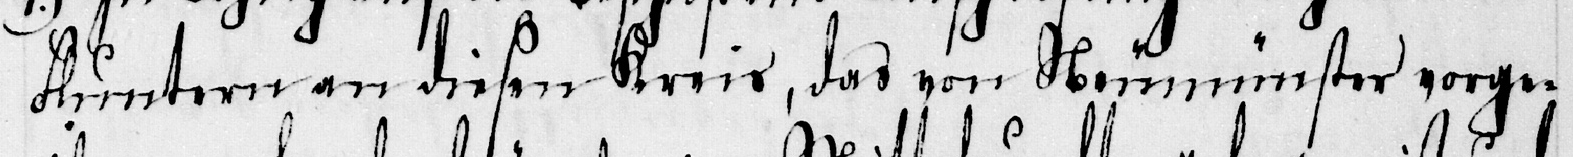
Fluntern an diesen Kreis, das von Neumünster vorges¬
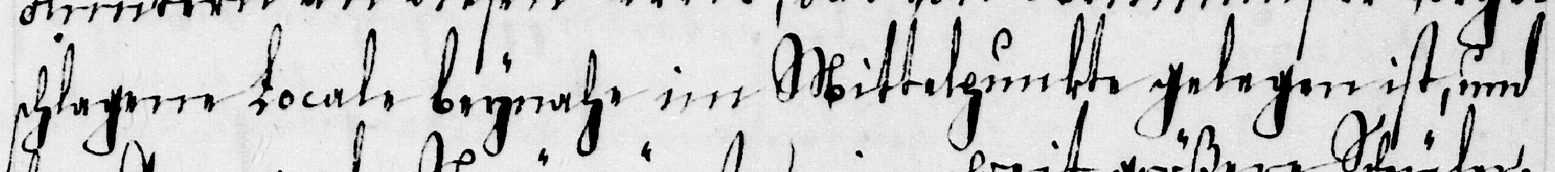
chlagene Locale beynahe im Mittelpunkte gelegen ist, und
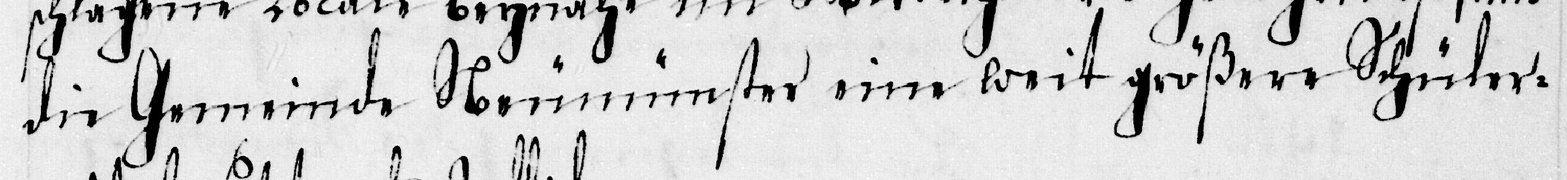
die Gemeinde Neumünster eine weit größere Schüler¬
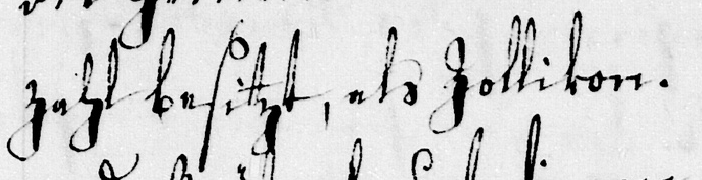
zahl besitzt, als Zollikon.
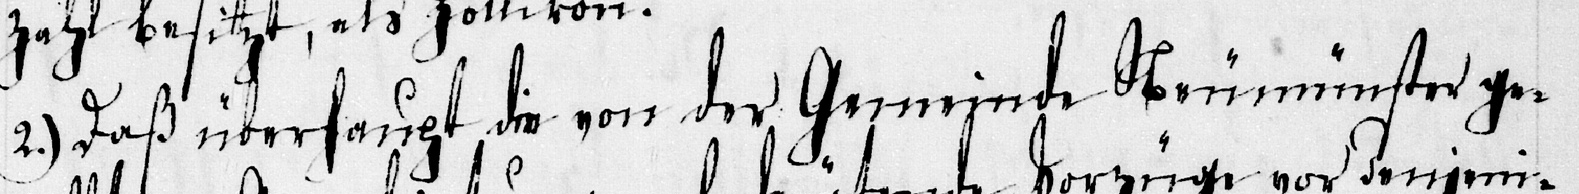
2.) Daß überhaupt die von der Gemeinde Neumünster ge¬
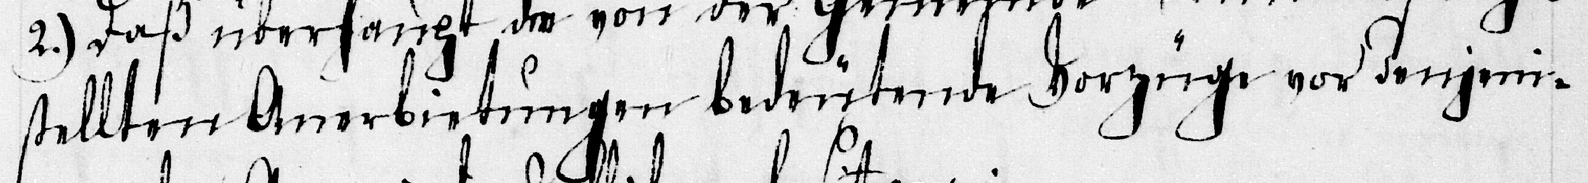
stellten Anerbietungen bedeutende Vorzüge vor denjeni¬
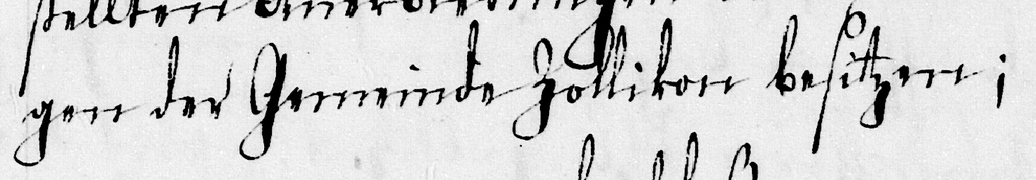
gen der Gemeinde Zollikon besitzen;
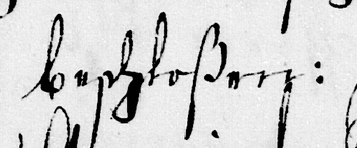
beschloßen:
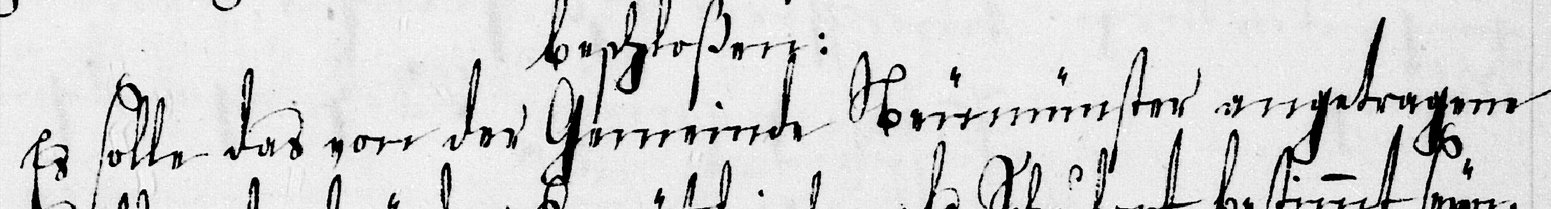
Es solle das von der Gemeinde Neumünster angetragene
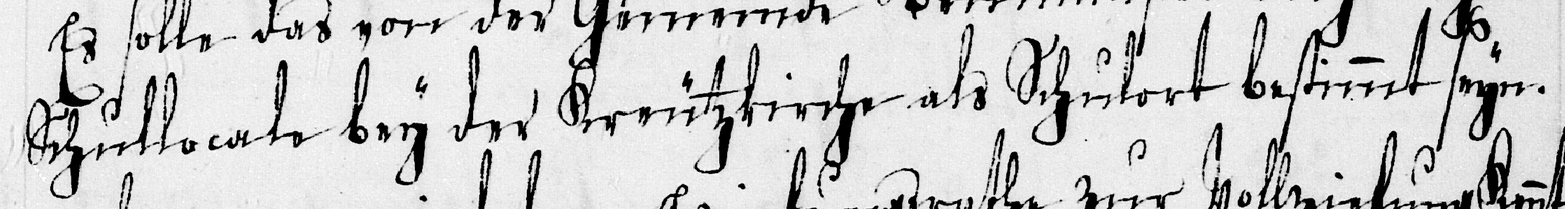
Schullocale bey der Kreutzkirche als Schulort bestimmt seyn.
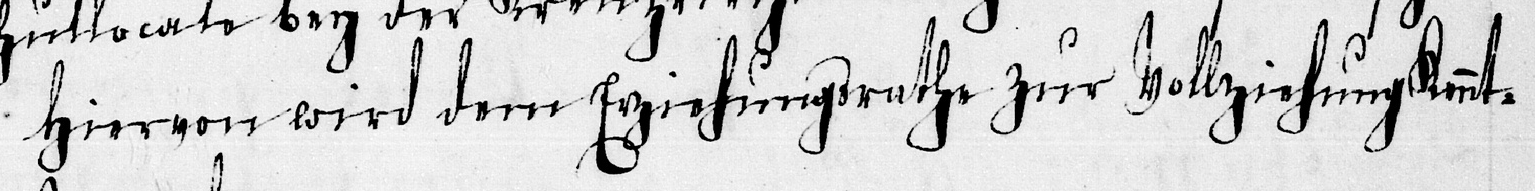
Hiervon wird dem Erziehungsrathe zur Vollziehung Kennt¬
